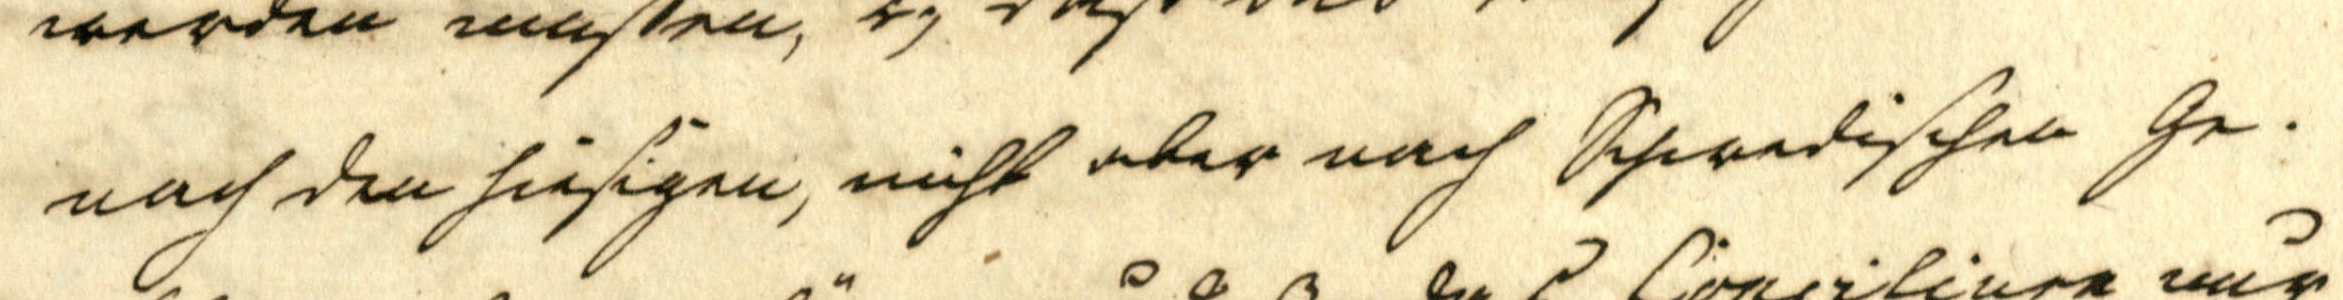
nach den hiesigen, nicht aber nach Schwedischen Ge¬
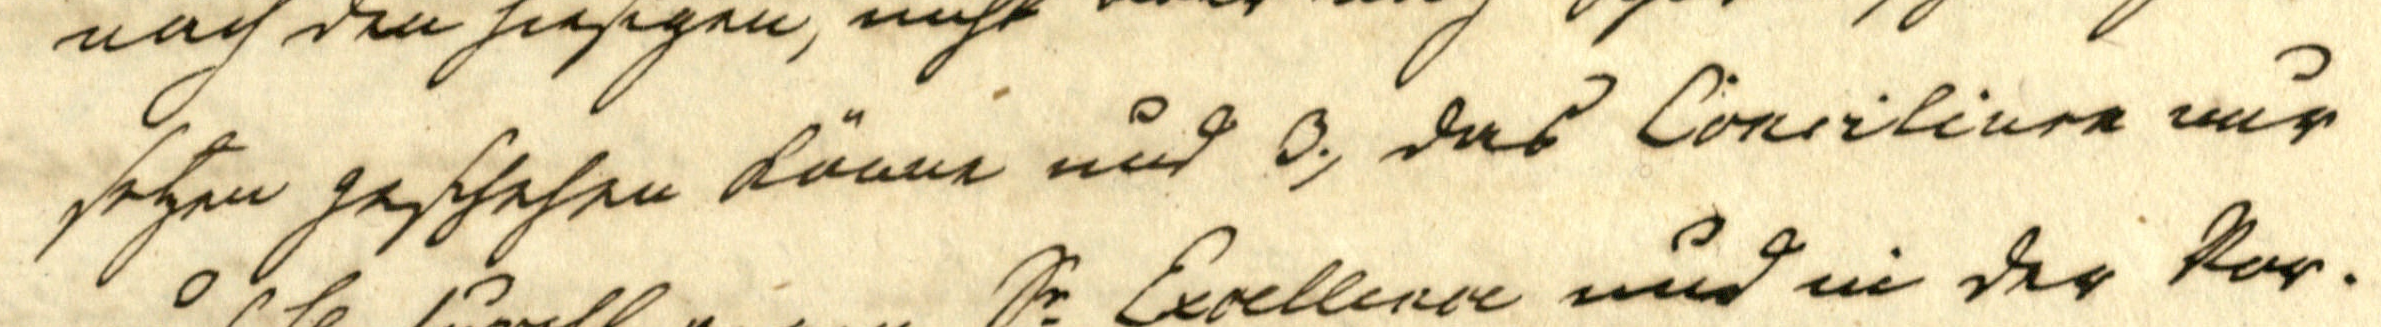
setzen geschehen könne und 3., das Concilium nur
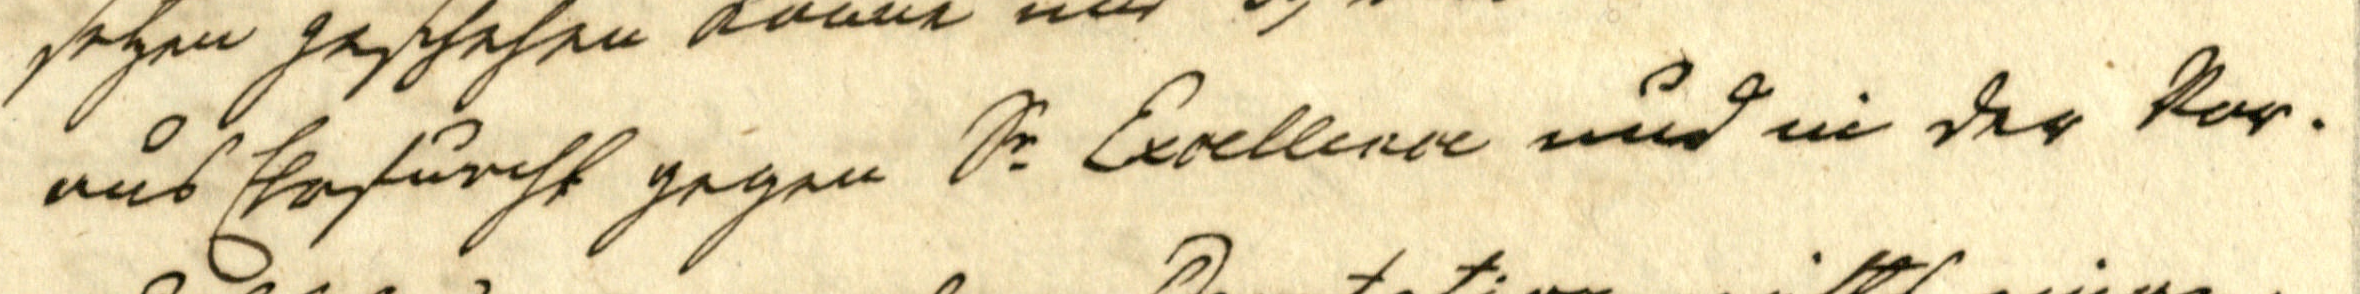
aus Ehrfurcht gegen Sr. Excellence und in der Vor¬
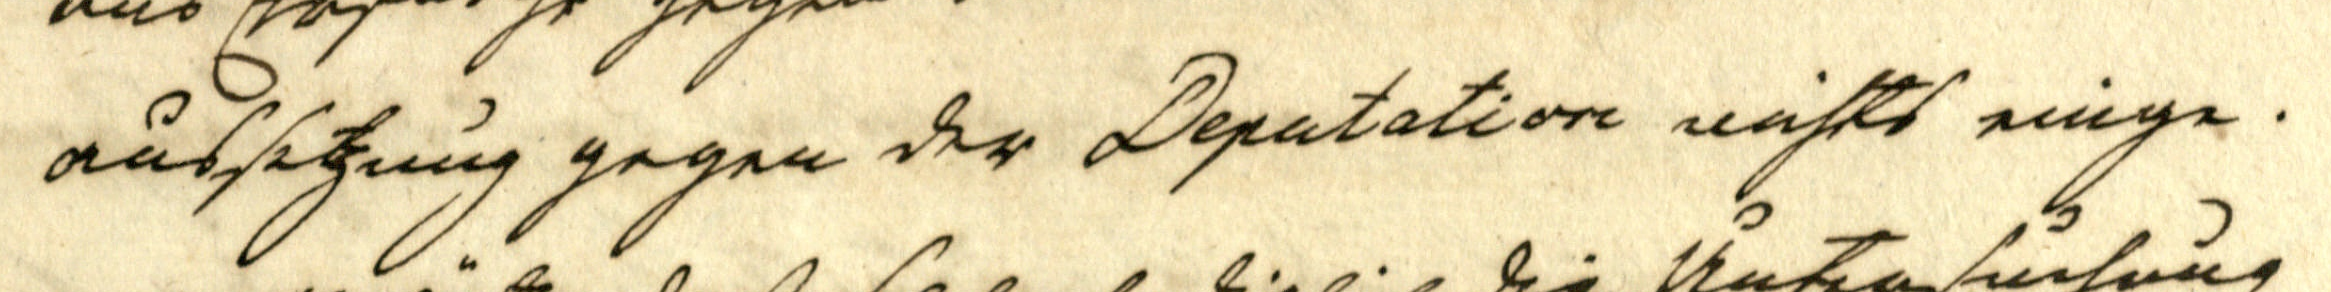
aussetzung gegen der Deputation nichts einge¬
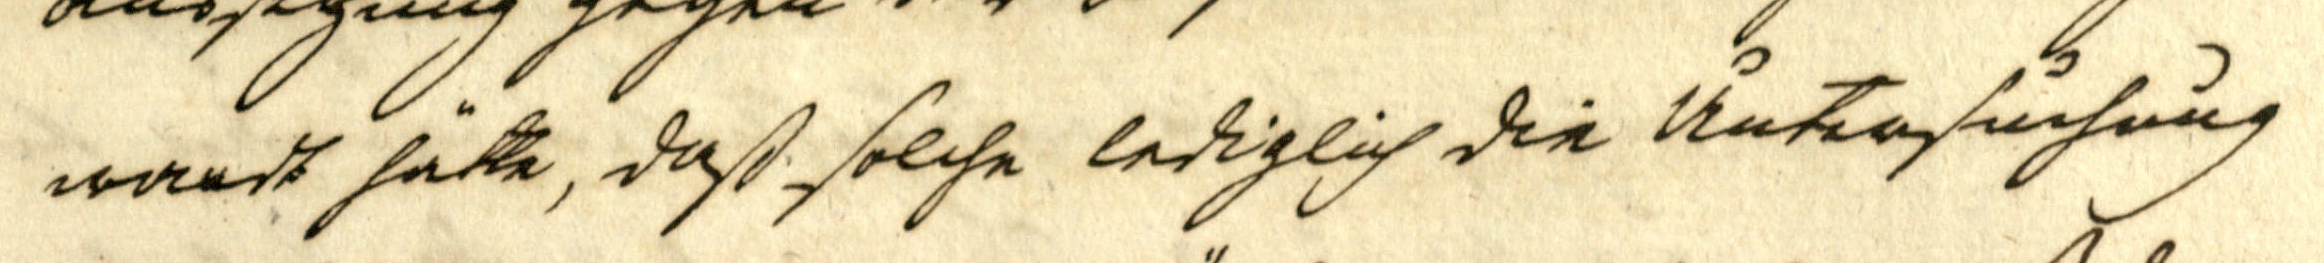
wandt hätte, daß solche lediglich die Untersuchung
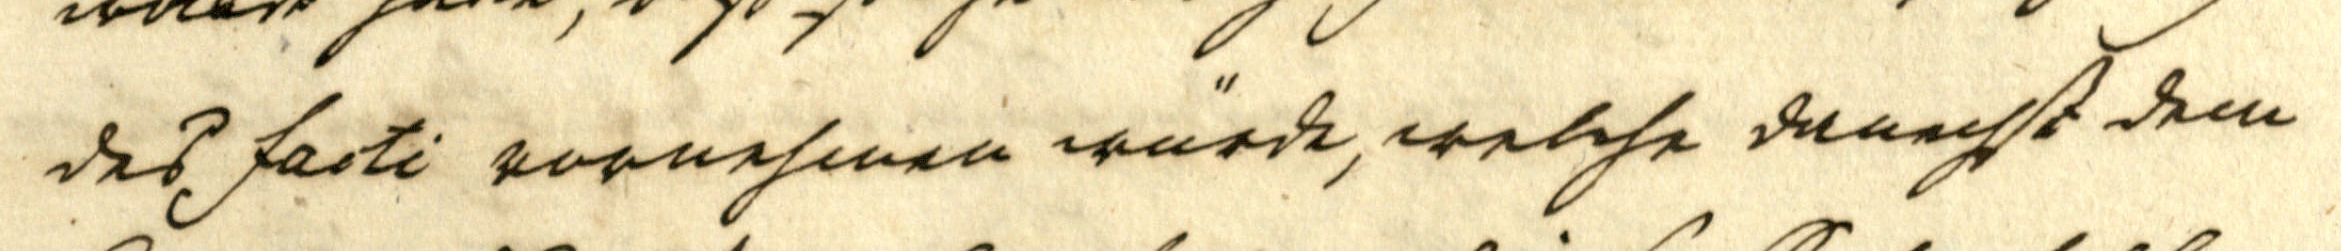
des Facti vornehmen würde, welche danechst dem
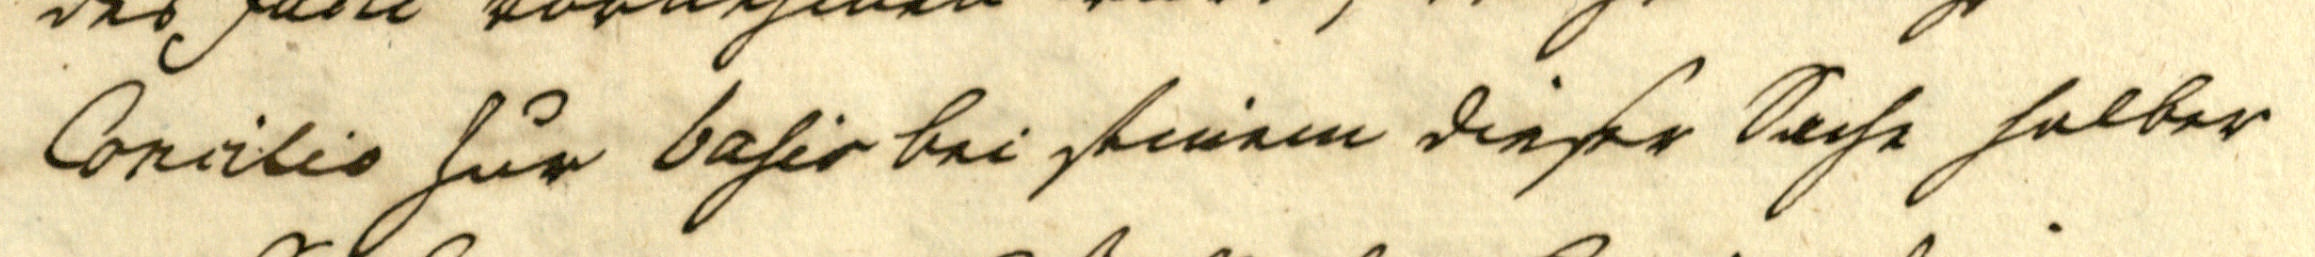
Concilio zur basis bei seinem dieser Sache halber
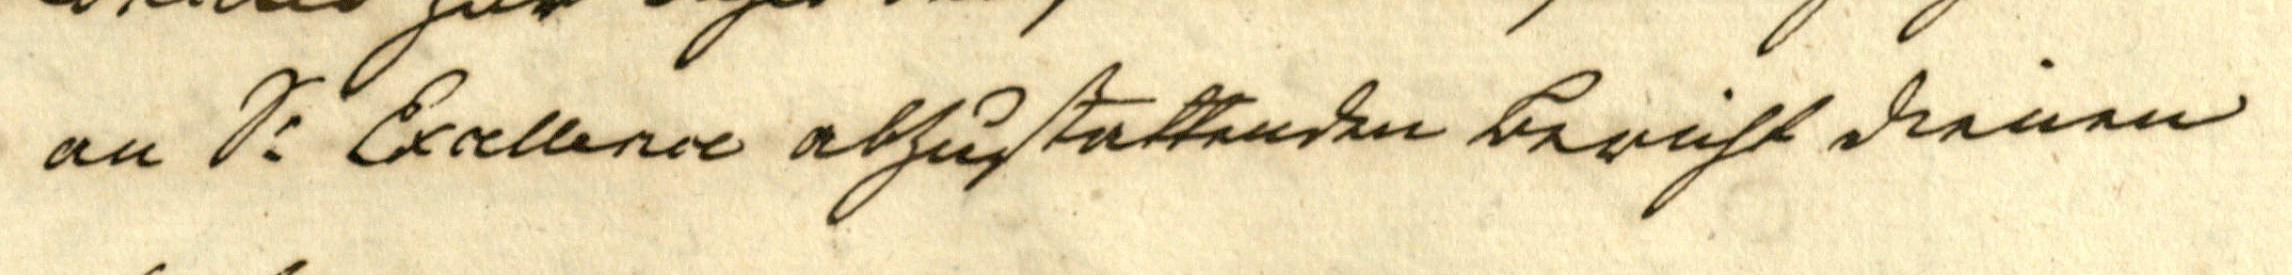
an Sr Excellence abzustattenden Bericht dienen
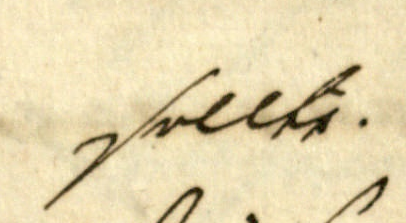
sollte.
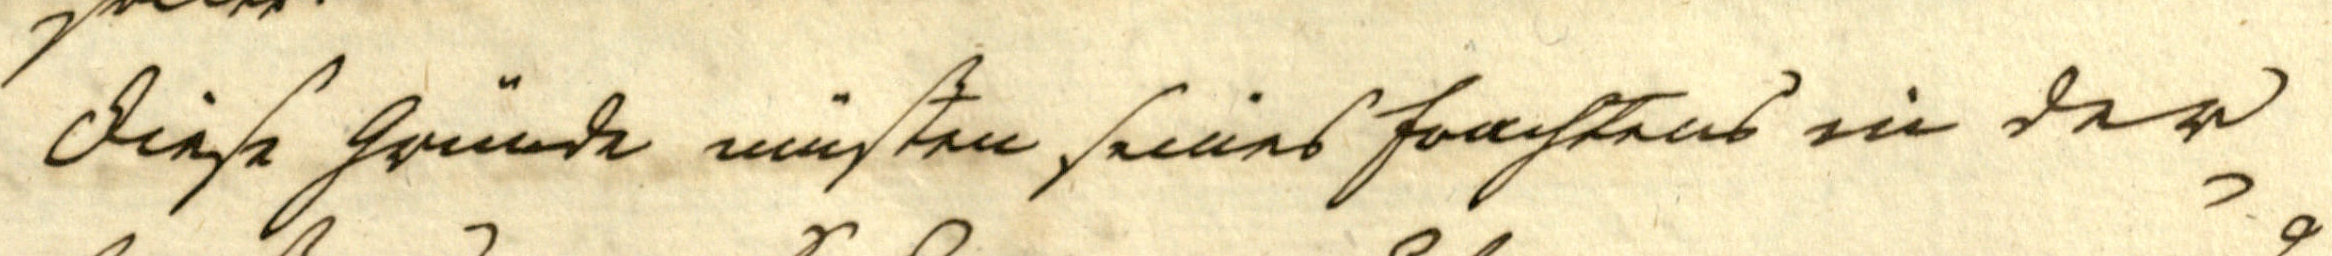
Diese Gründe müssen seines Erachtens in der
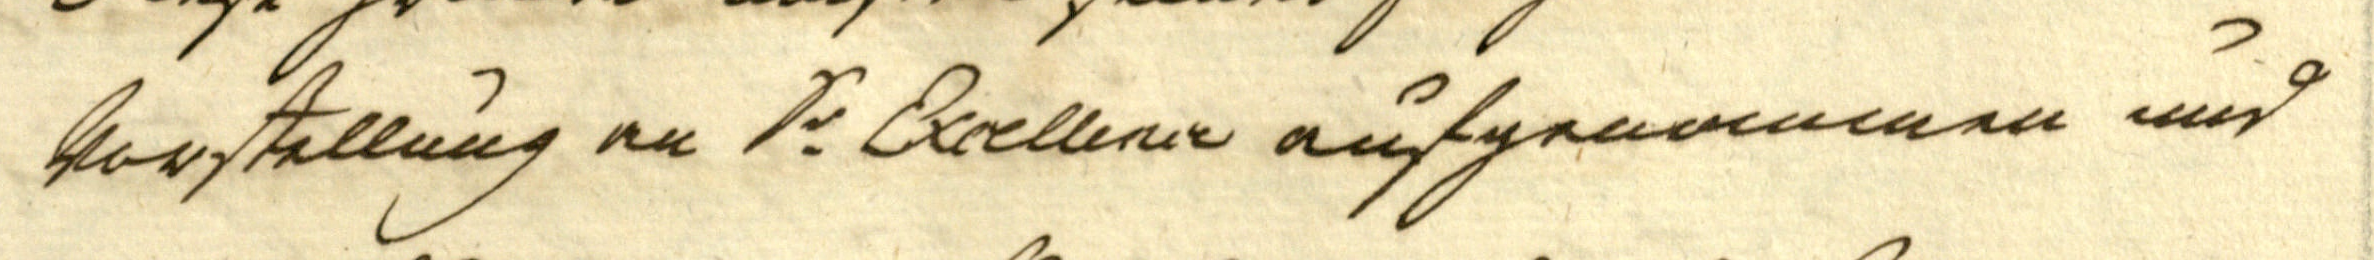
Vorstellung an Sr. Excellence aufgenommen und
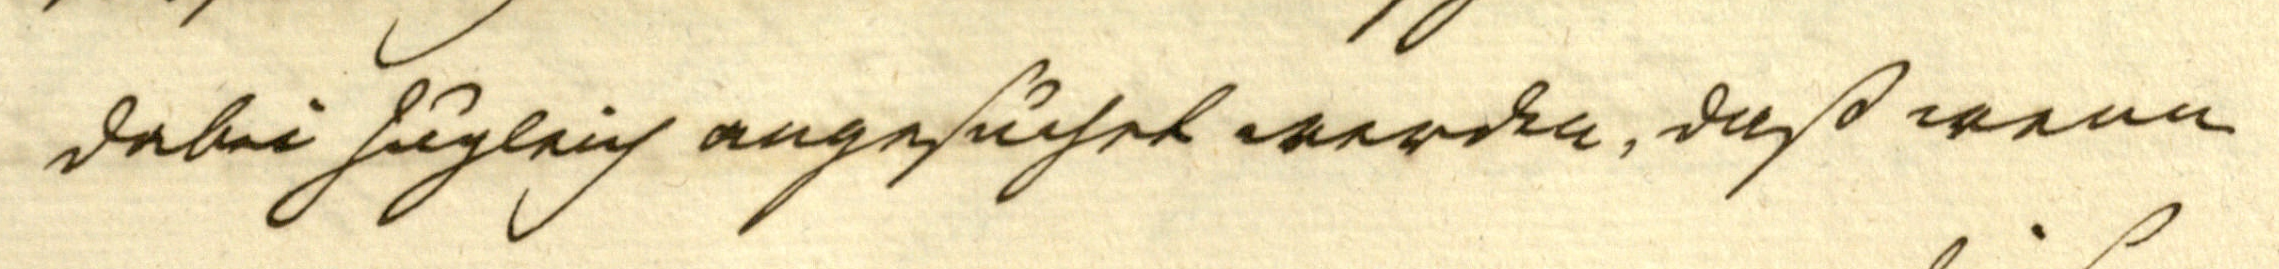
dabei zugleich angesuchet werden, daß wenn
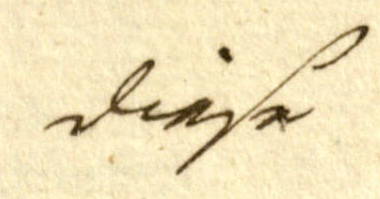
diese
